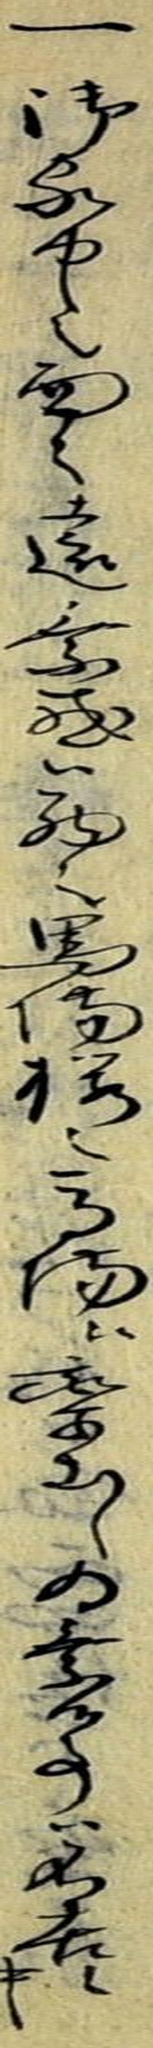一御家中之面々遠乗或ハ西之馬場桜之馬場江牽出し為乗候事ハ不苦候事
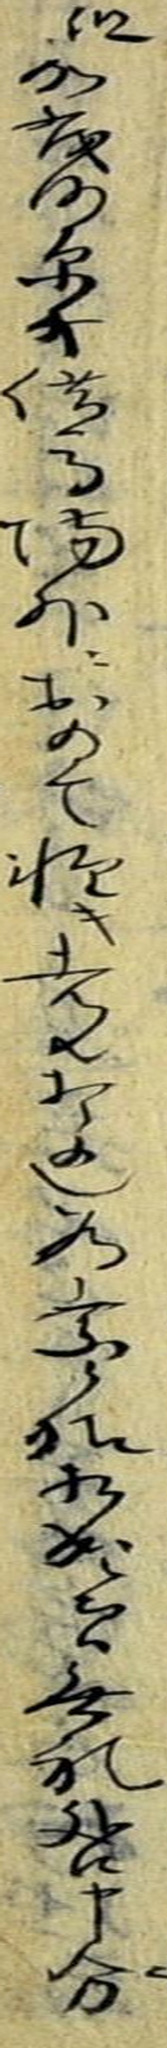但加茂河原町借馬場外ニおゐて軽キ者共打込為乗候様相成候而ハ無礼咎申分
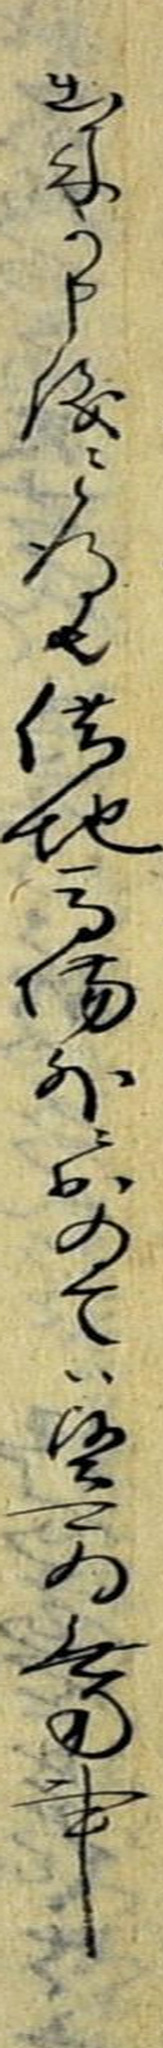出来可申儀ニ候得者借地馬場外ニおゐてハ堅可為無用事
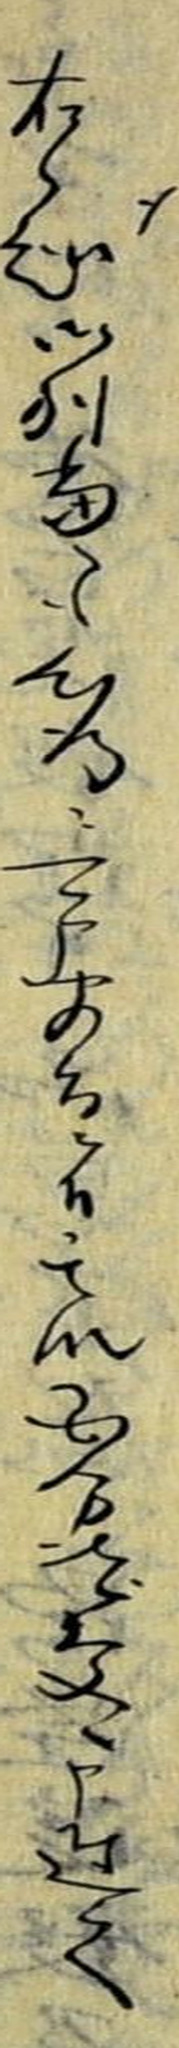右之趣御別当へも心得ニ可申聞旨ニ付其段国分次郎大夫へ申達之
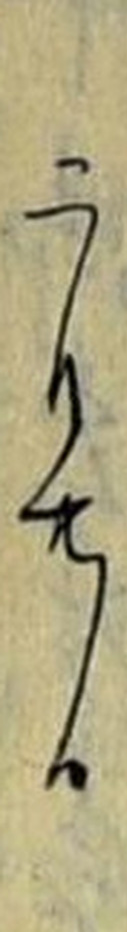二月廿日
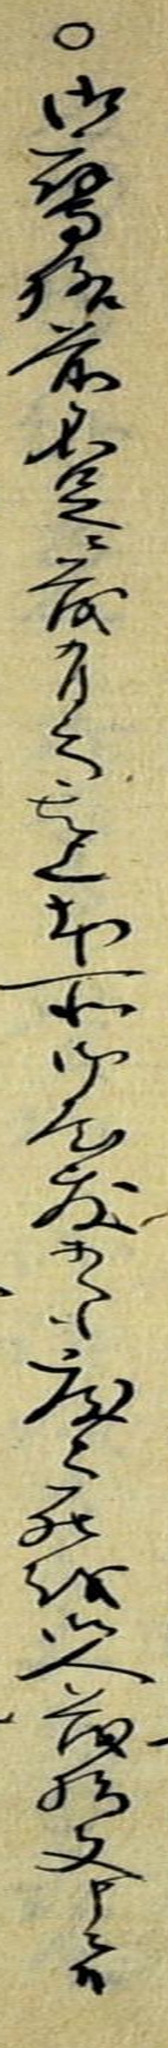〇御鷹格前不足ニ茂有之其上本所御屋敷等へも度々罷越御人茂指支申ニ付
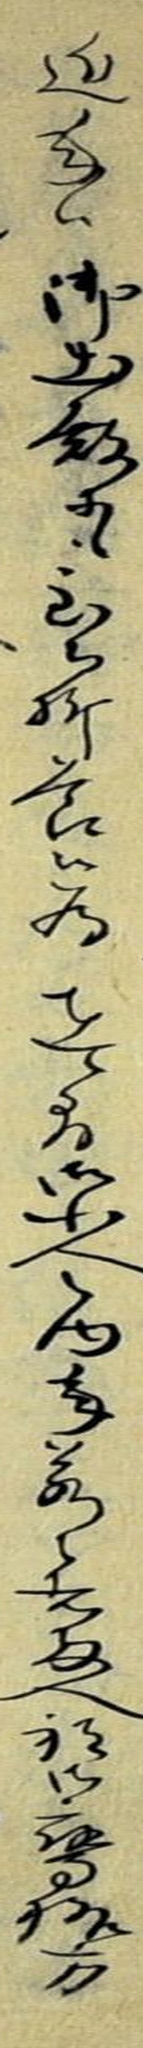近年ハ御出殿等も至而折節被為在候間御小人之内年若之者両人程御鷹格方
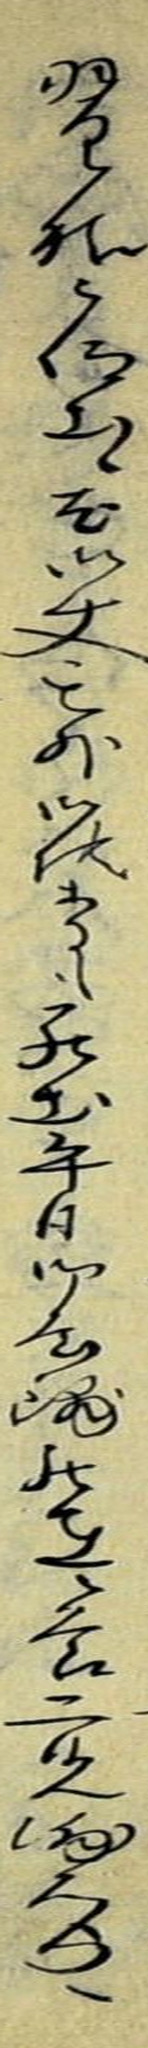習候様被仰出候尤御使其外御供等にも罷出平日御屋鋪罷在候節二見浦右衛門へ
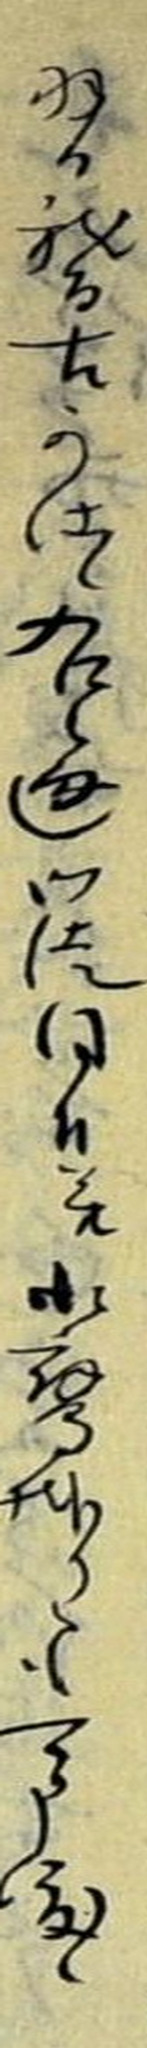習稽古可仕候右之通御徒目付并御鷹掛りへも可申渡候
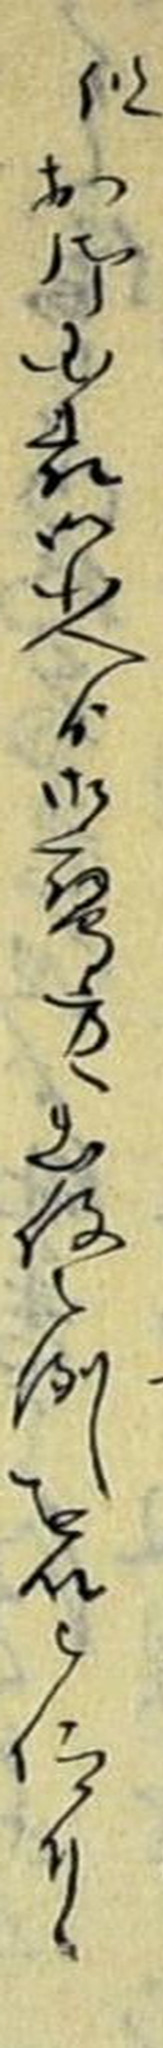但於御国表御小人ゟ御鷹方へ出役之例を以被仰付候
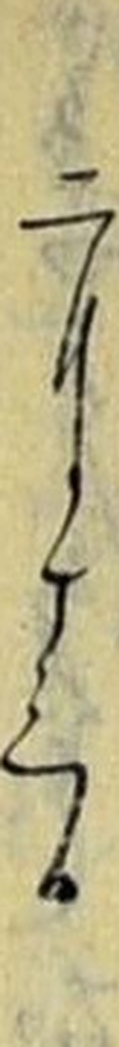二月十三日
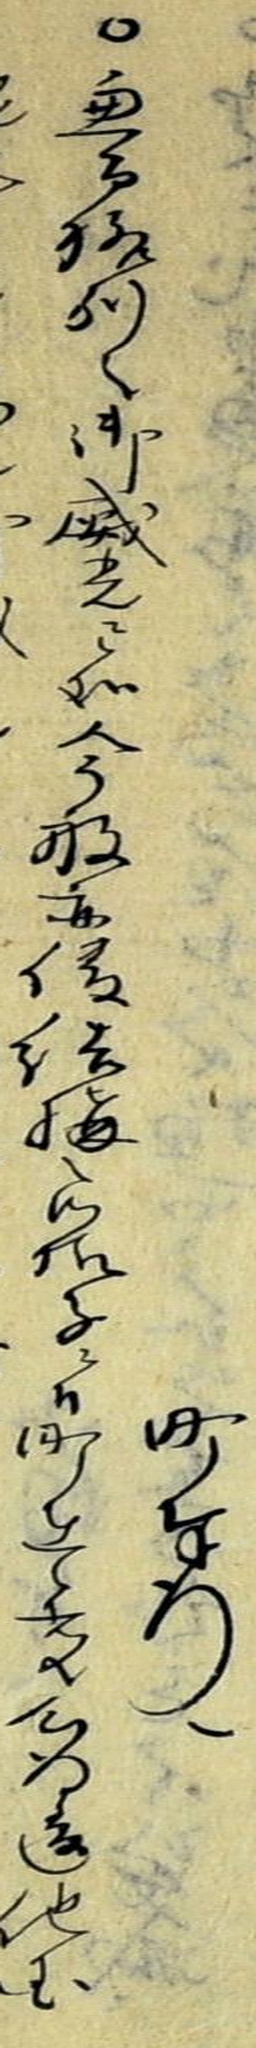〇兼而格別之御威光ニ候処今般亦復結構之御様子ニ付町在之者共心得違他国
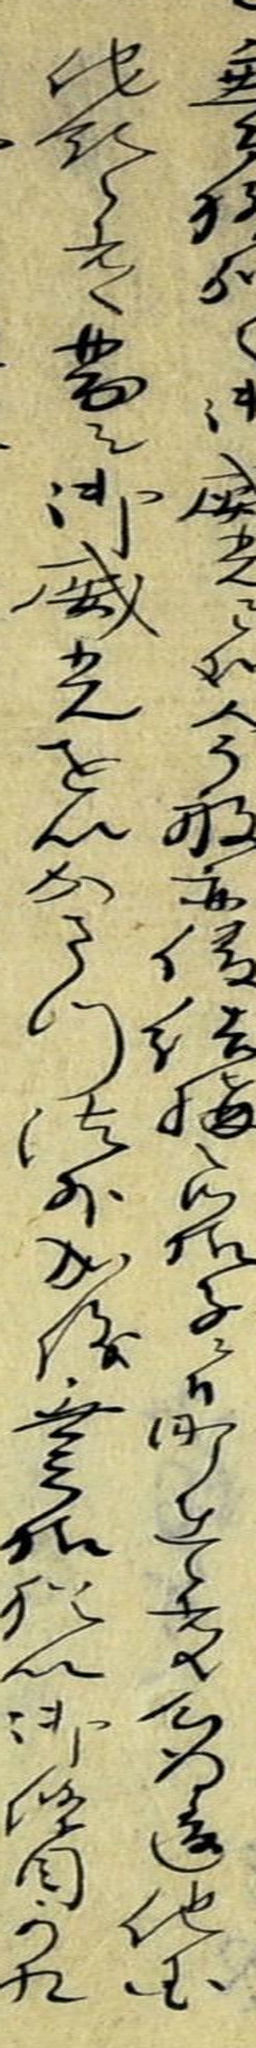他領之者へ対シ御威光を以かさつ法外成儀無之様猶以御条目可相
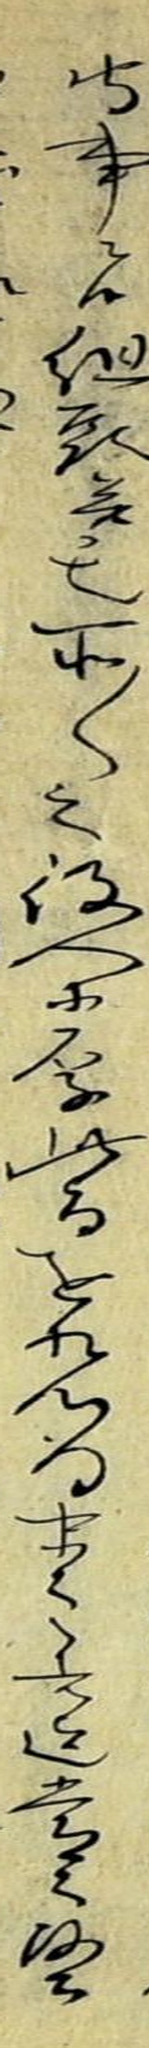守事ニ候組頭并其所〳〵之役人等厚此旨を相心得末々之者迄常々堅
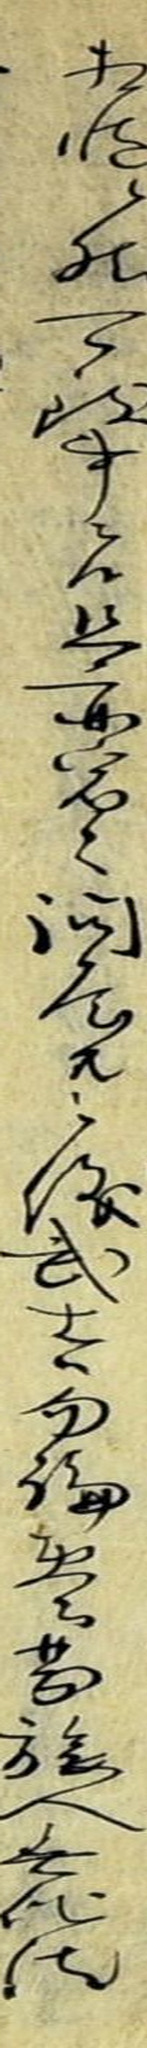相慎候様可致事ニ候且亦宿々問屋共之儀武士ハ勿論惣而対旅人無作法
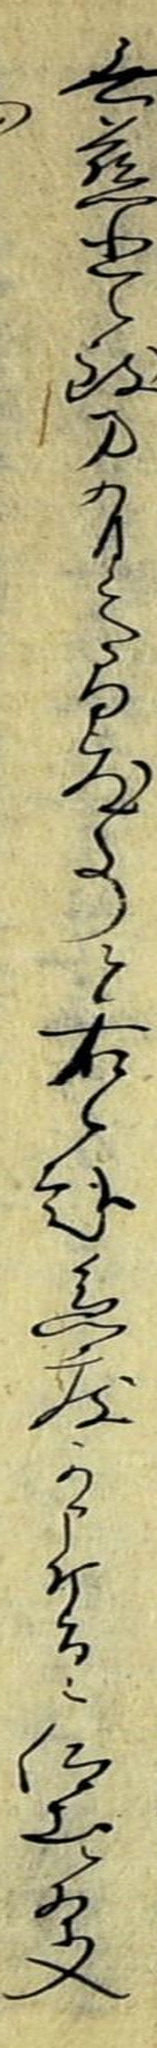無慈悲之致方有之間敷事ニ候右之趣急度可申付旨被仰出候条入
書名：命令之部 三
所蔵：福井県文書館 Fukui Prefectural Archives
